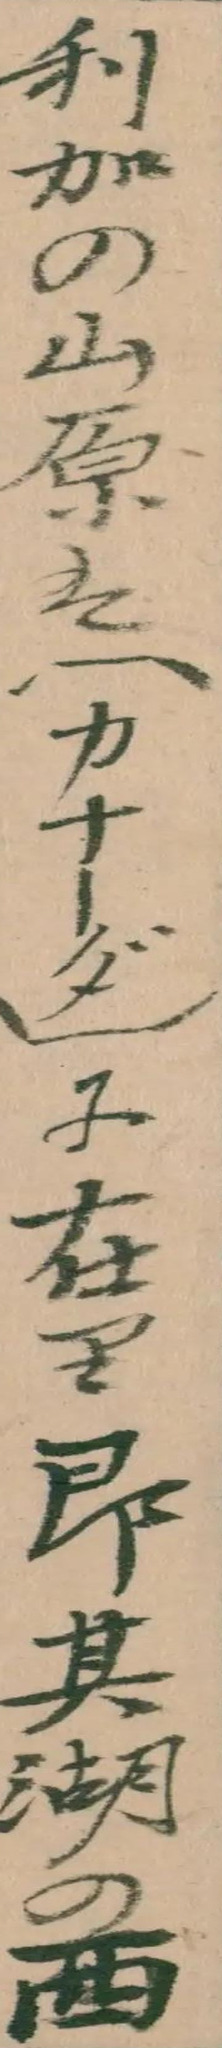利加の山原は(カナーダ)に在り即其湖の西
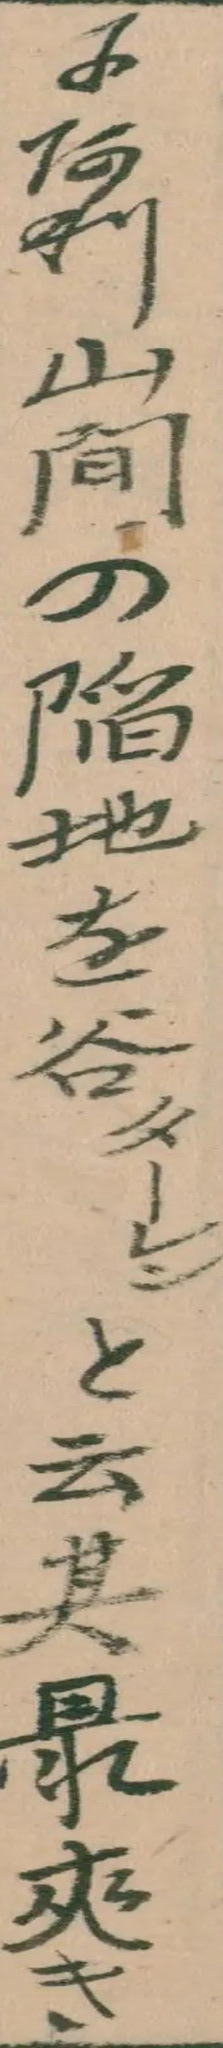にあり山間の陥地を谷ターレンと云其最夾き
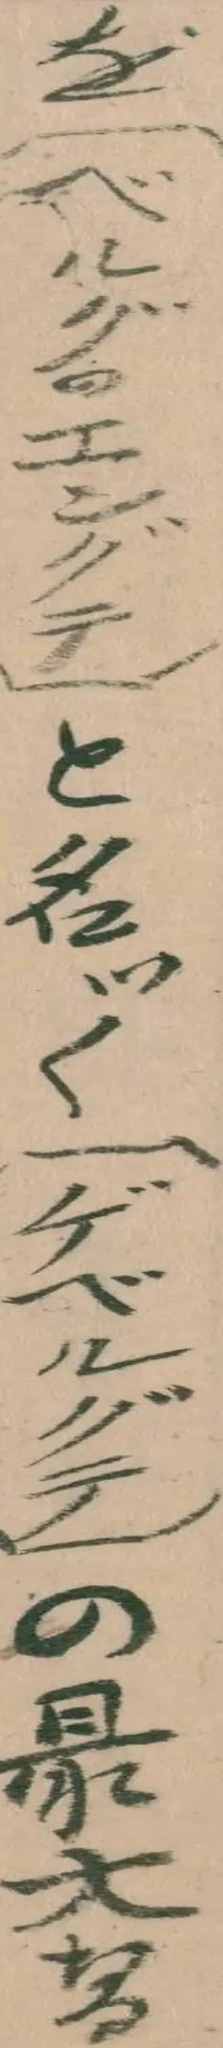を(ベルグ・エングテ)と名ツく(ゲベルグテ)の最大なる
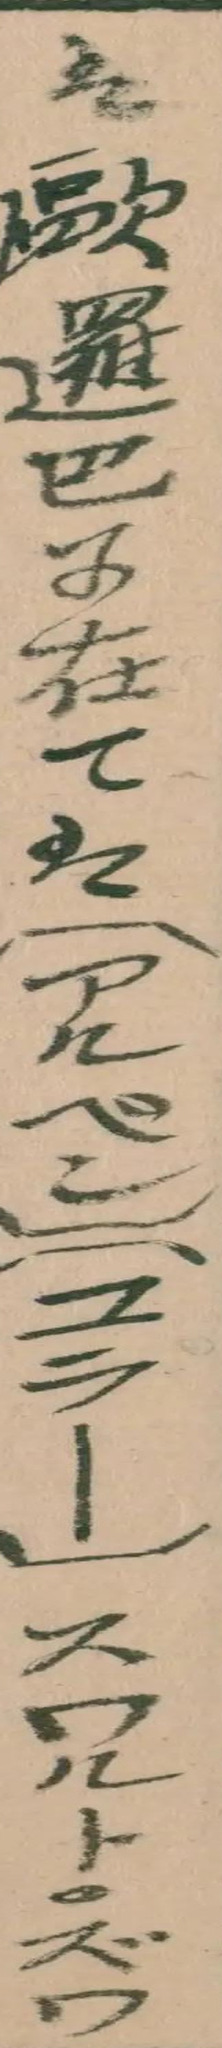は欧邏巴に在ては(アルペン)(ユラー)スワルト・ズワ
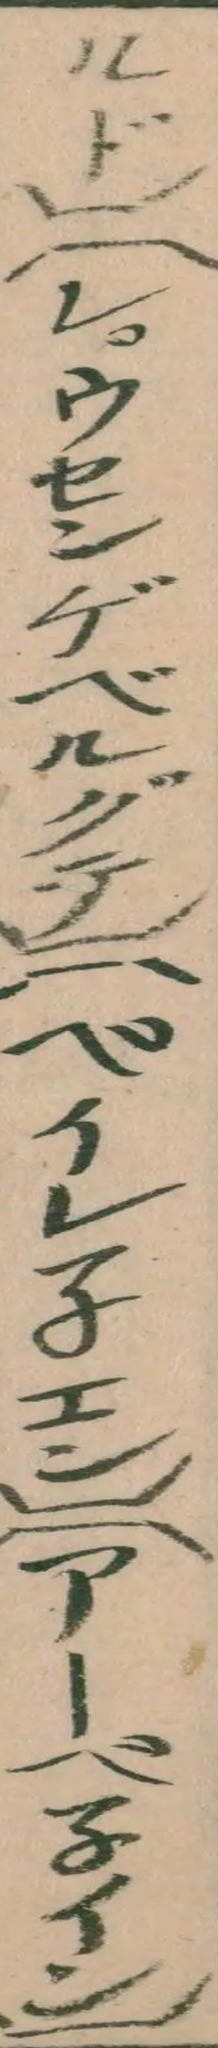ルド)(レウセンゲベルグテ)(ペイレネエン)(アーペネイン)
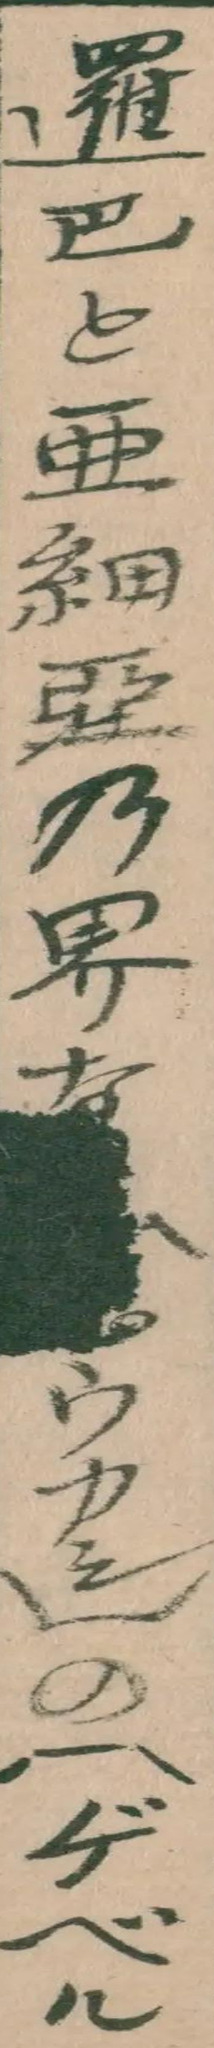邏巴と亜細亜の界な(ウカシ)の(ゲベル
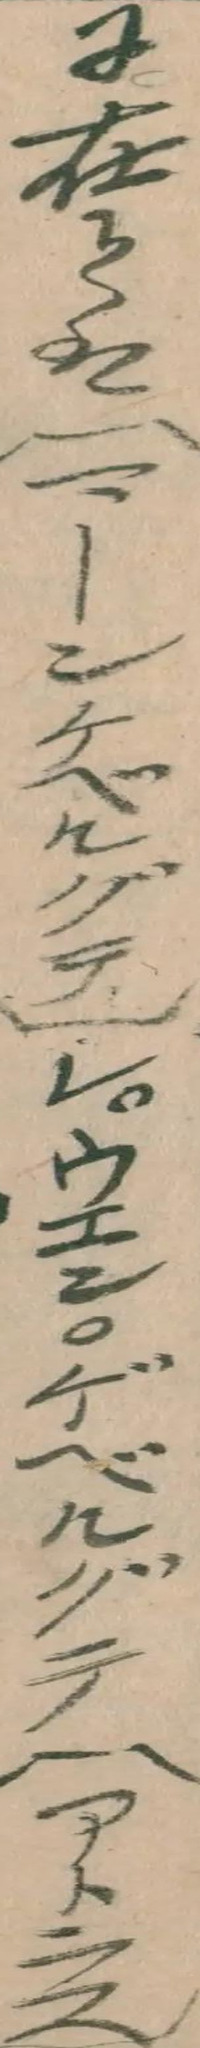に在ては(マーンケベルグテ)レウエン・ゲベルグテ(アトラス)

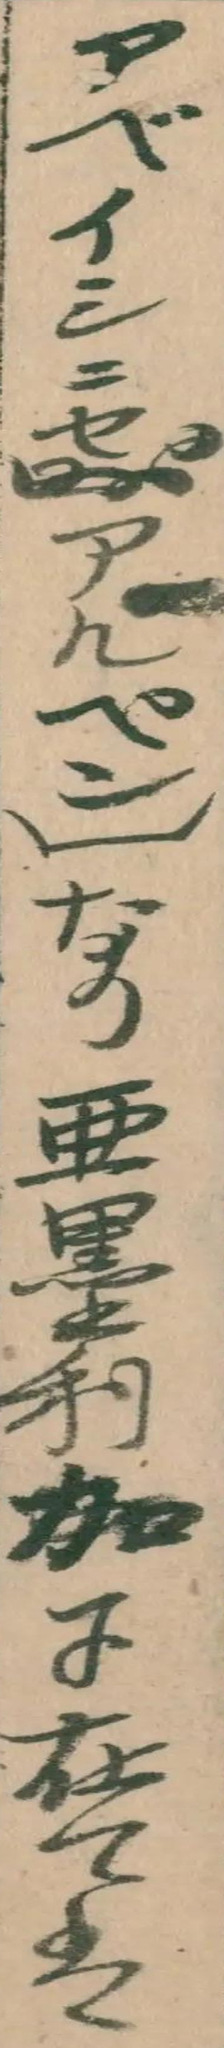アベイシニセアルペン)なり亜墨利加に在ては
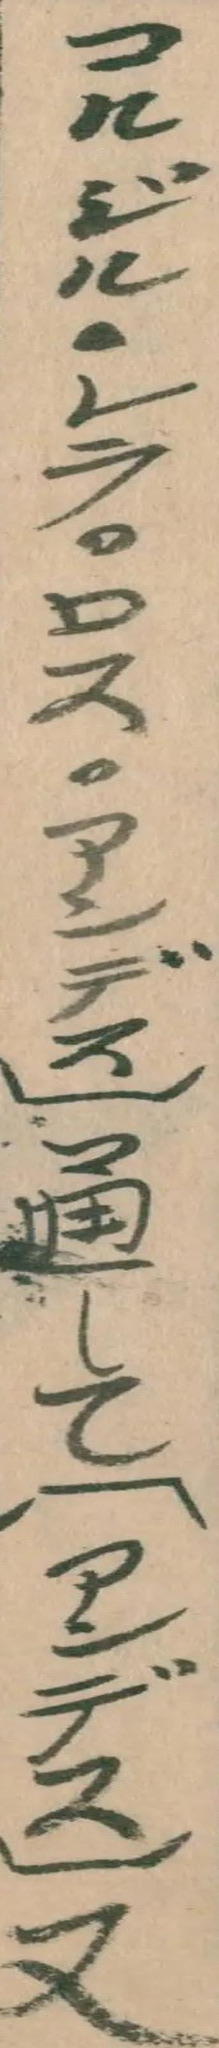コルジル・レラ・ロス・アンデス)通して(アンデス)又
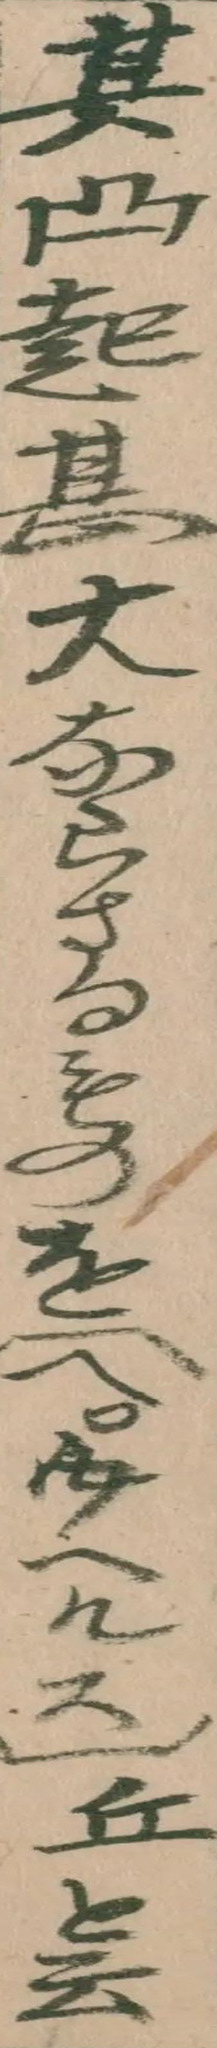其凸起甚大ならさるものを(ヘウヘルス)丘と云
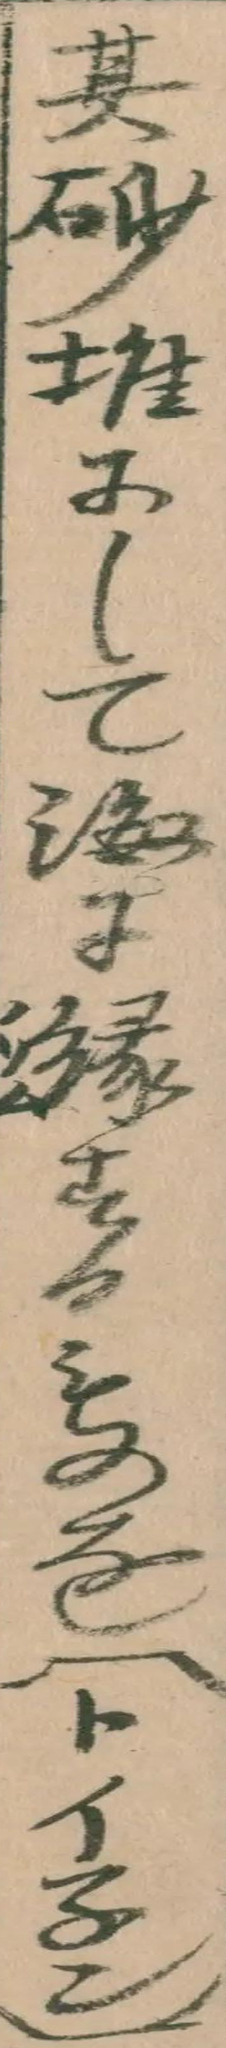其砂堆にして海に縁するものを(トイネン)
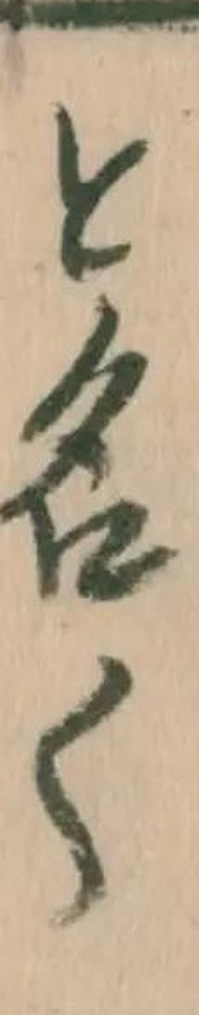と名く
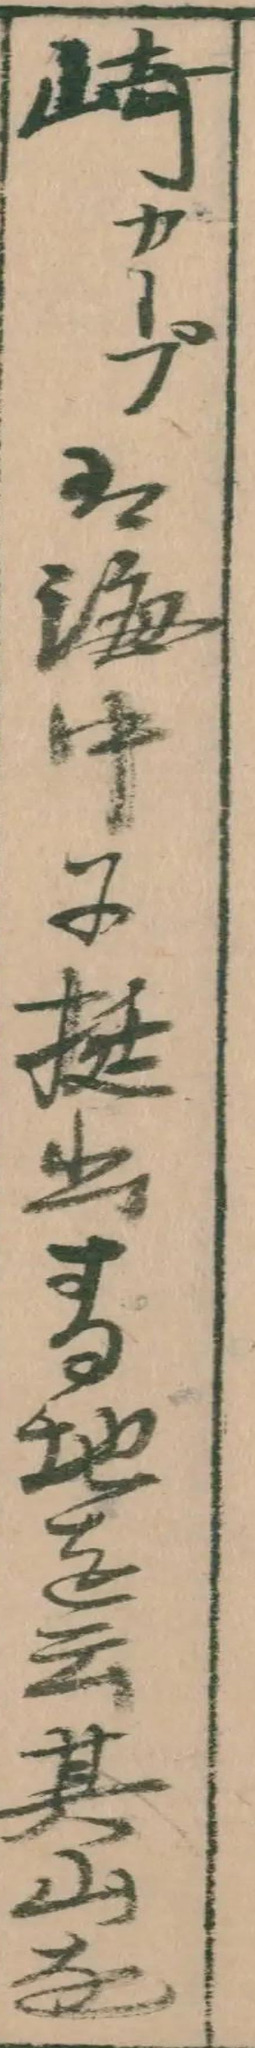崎カープは海中に挺出する地を云其山を
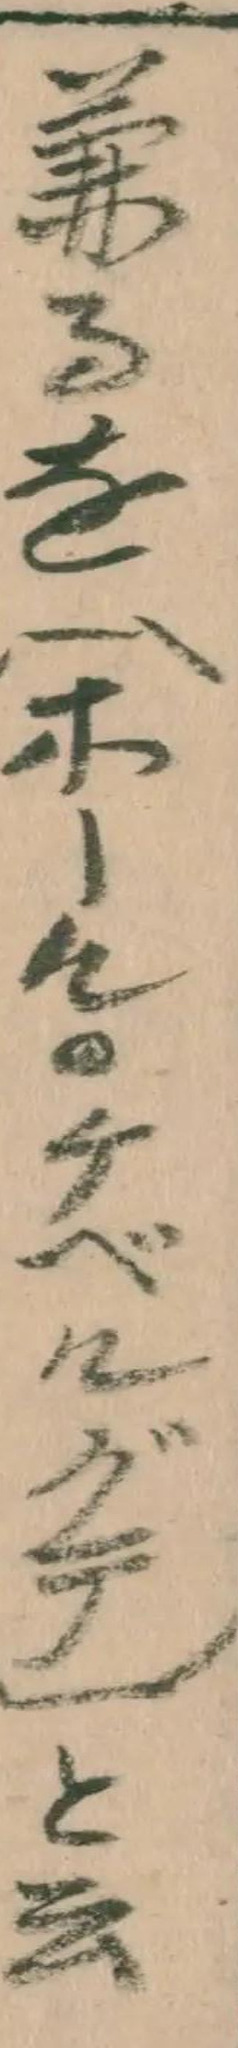兼るを(ホール・ケベルグテ)と云
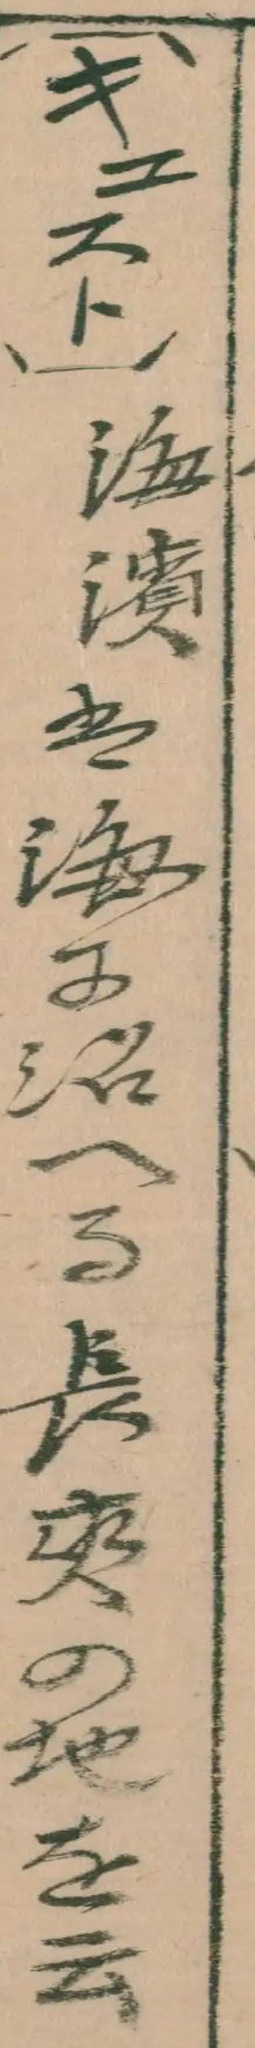(キュスト)海浜は海に沿へる長夾の地を云
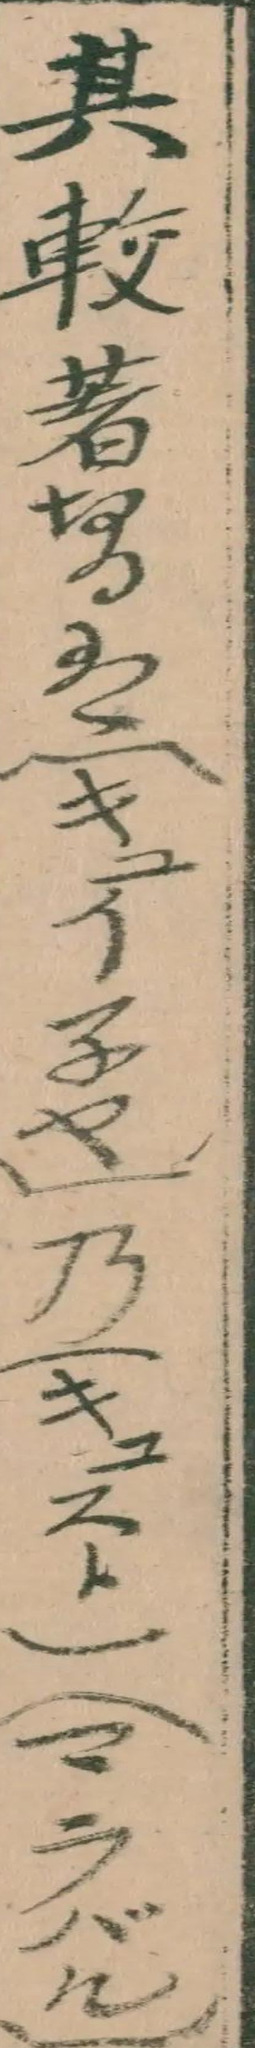其較著なるは(キュイネヤ)の(キュスト)(マラバル)
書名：新釈輿地図説
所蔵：国立国会図書館 National Diet Library, JAPAN
